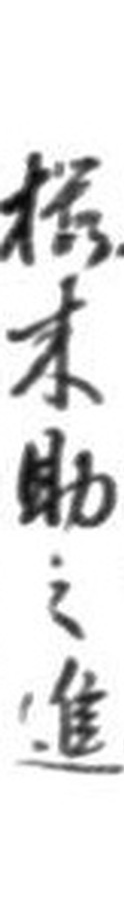桜木助之進
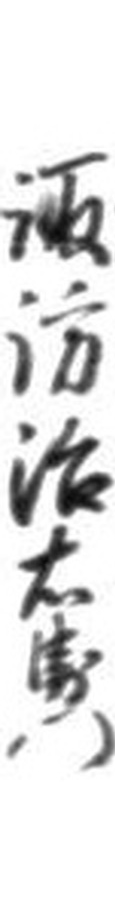諏訪治右衛門
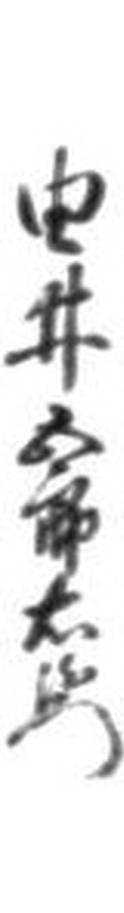由井五郎右衛門
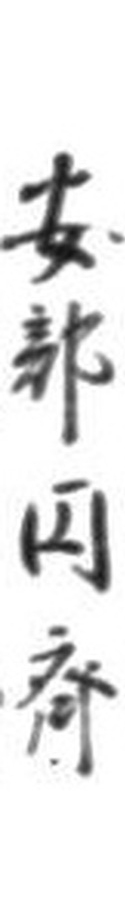安部円斎
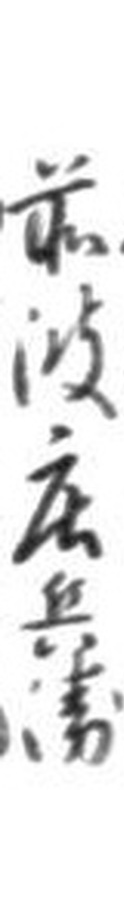前波庄兵衛
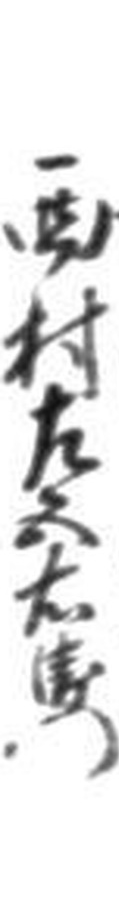西村左五右衛門
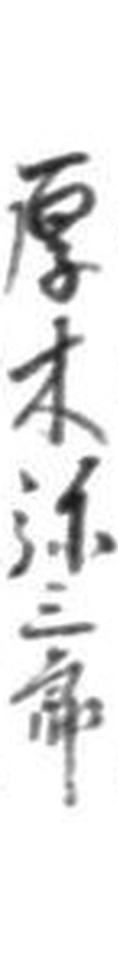厚木弥三郎
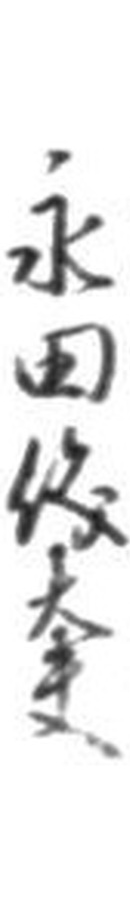永田儀大夫
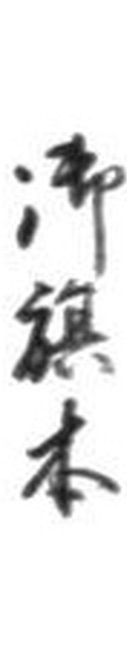御旗本
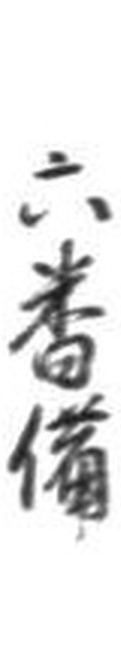六番備
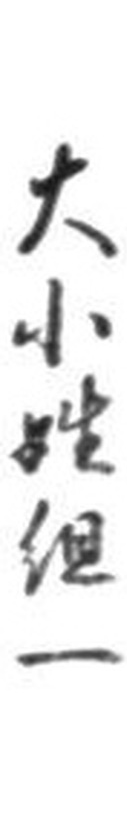大小姓組一

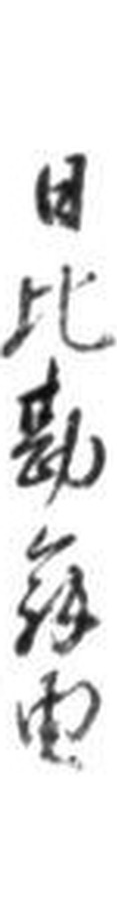日比勘解由
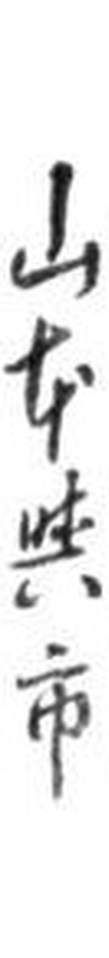山本与市
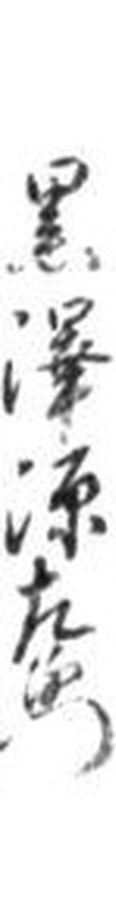黒沢源左衛門
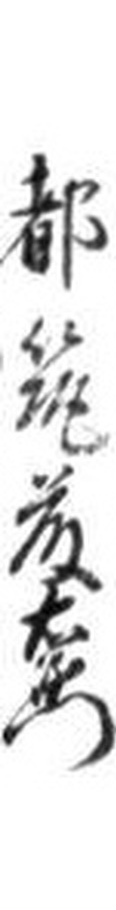都築藤右衛門
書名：家譜 二 忠直公 従文禄四年到慶安四年
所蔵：福井県文書館 Fukui Prefectural Archives
